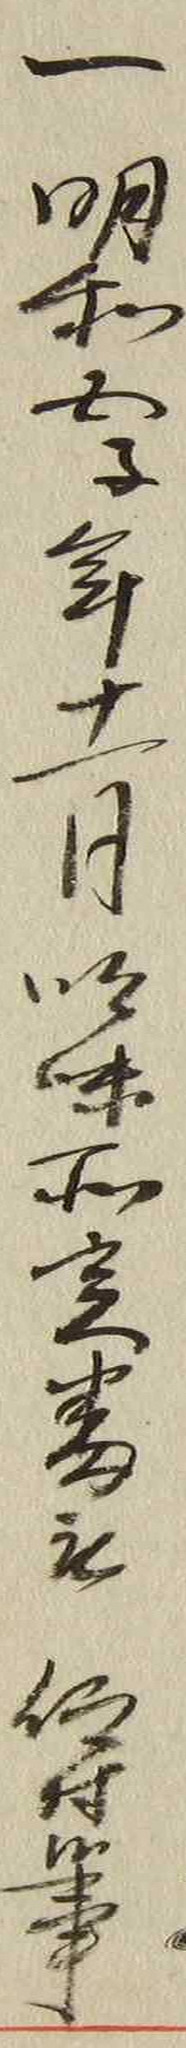一明和五子年十一月吟味所定番被仰付候事
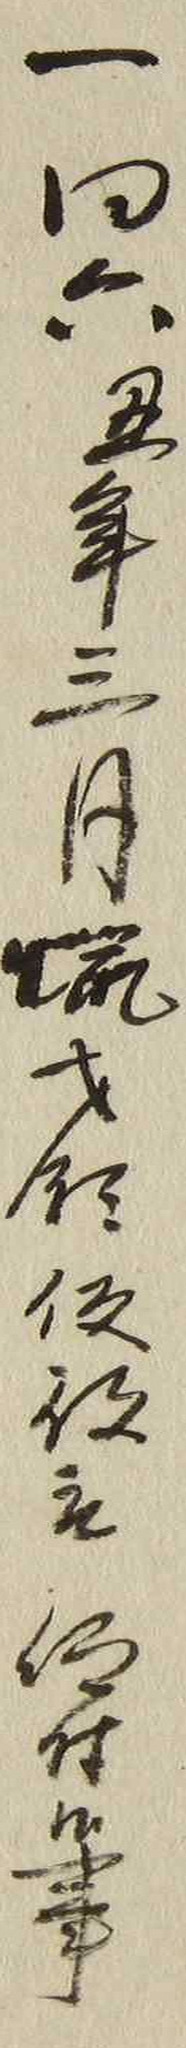一同六丑年三月蝋才領仮役被仰付候事
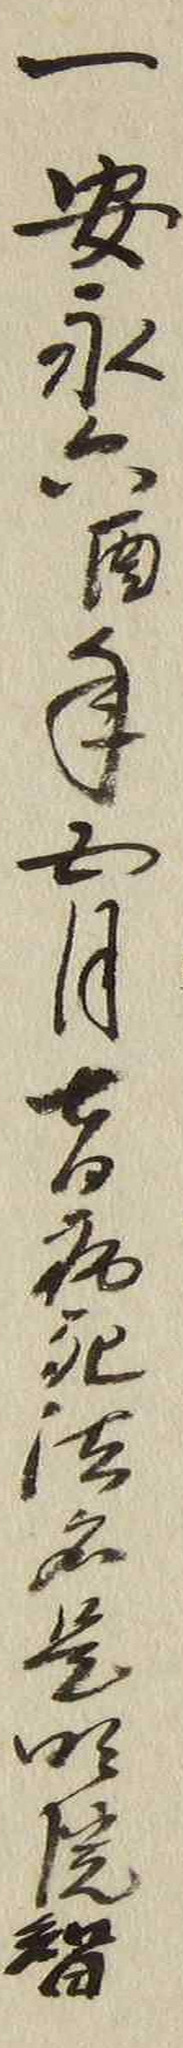一安水六酉年五月七日病死法名是明院智
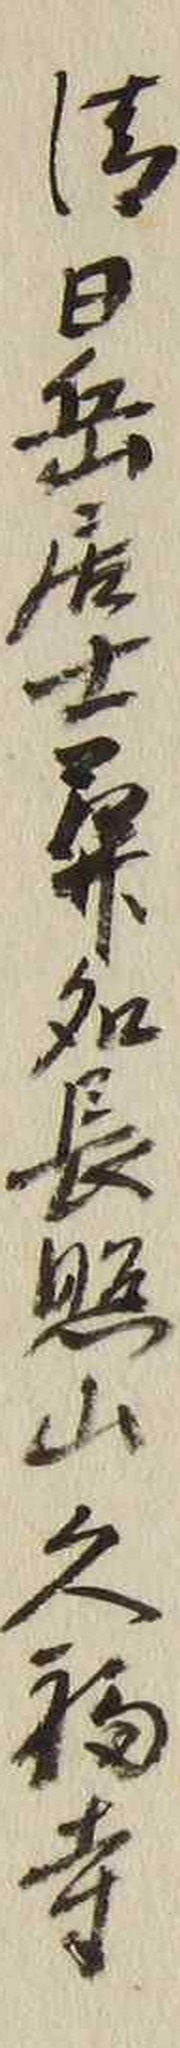清日岳居士葬処長照山久福寺

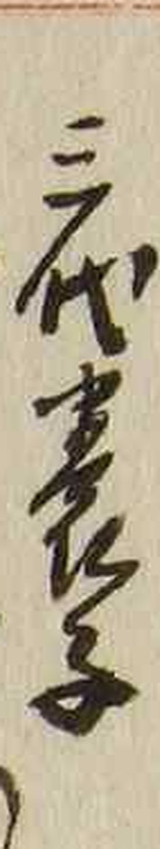三代養子
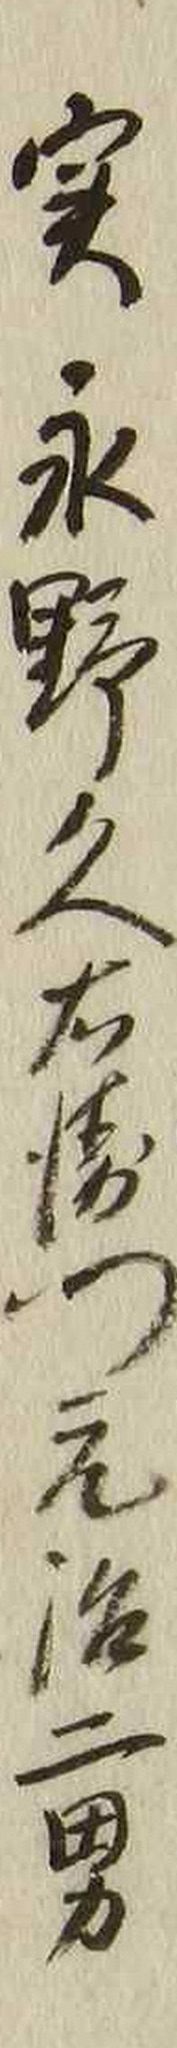実永野久右衛門元治二男
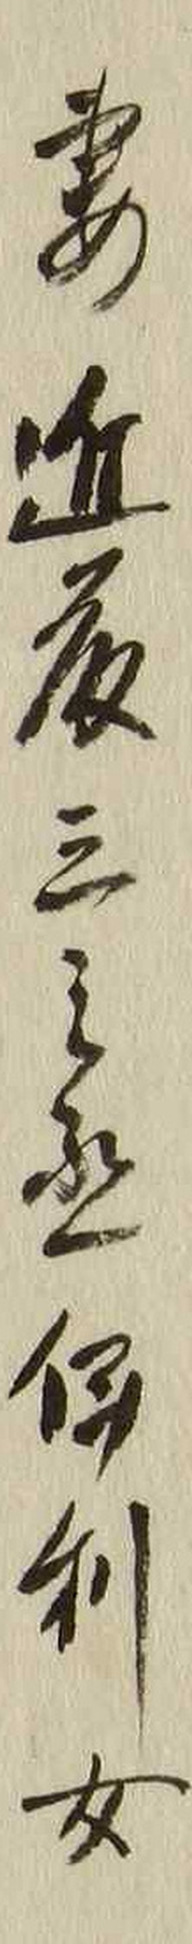妻近藤三之丞伊利女
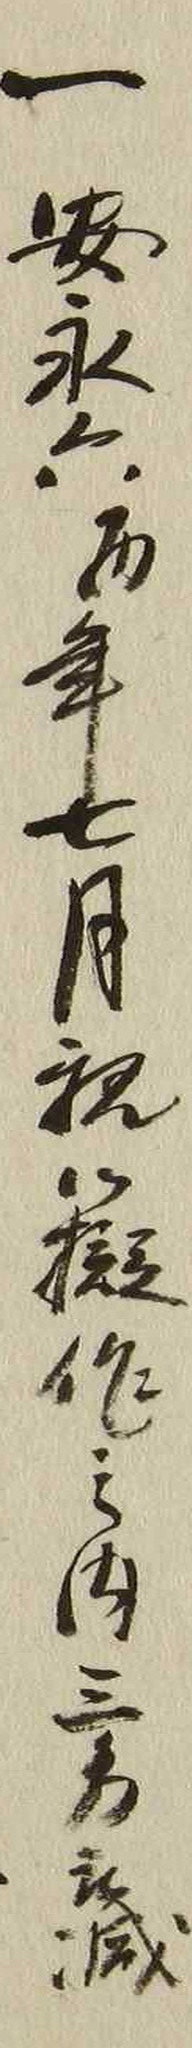一安永六酉年七月親御擬作之内三分被減
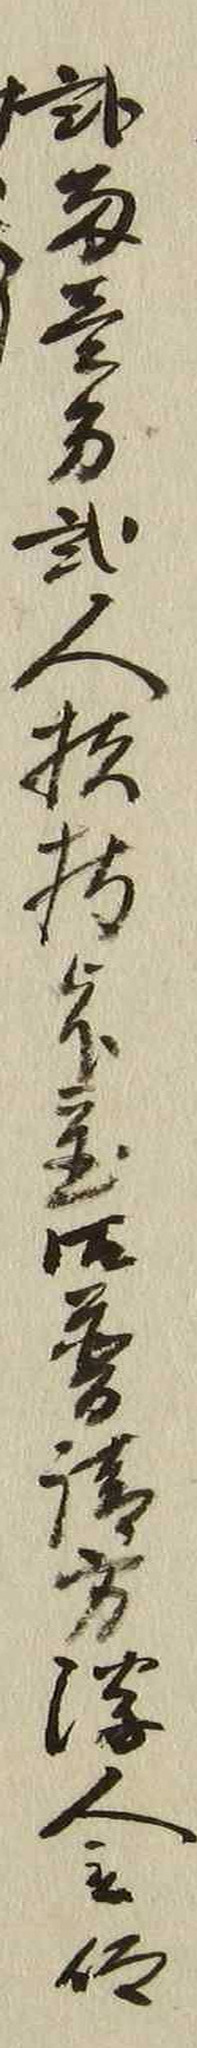弐両壱分弐人扶持被下置御普請方浮人被仰
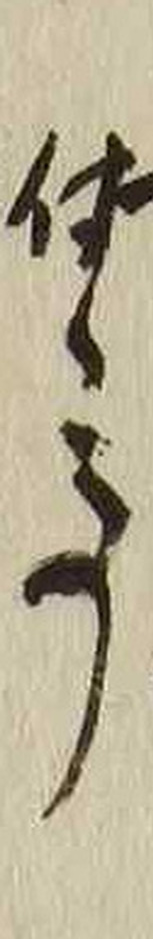付候事
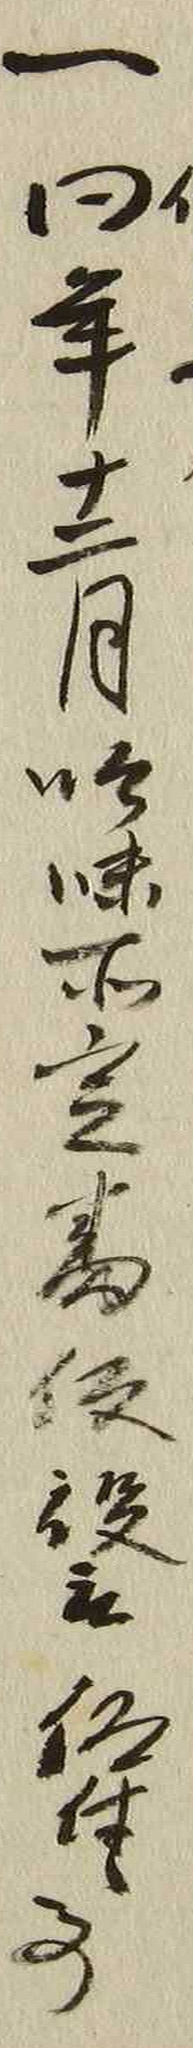一同年十二月吟味所定番仮役被仰付候事
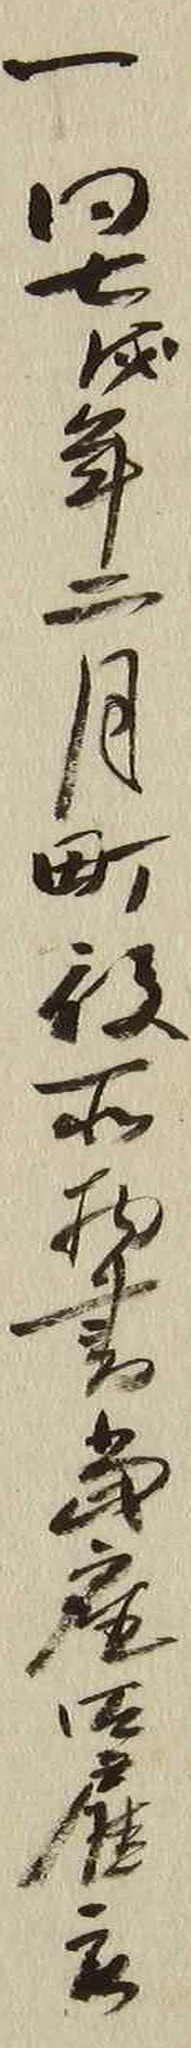一同七戌年二月町役所物書当座御雇被
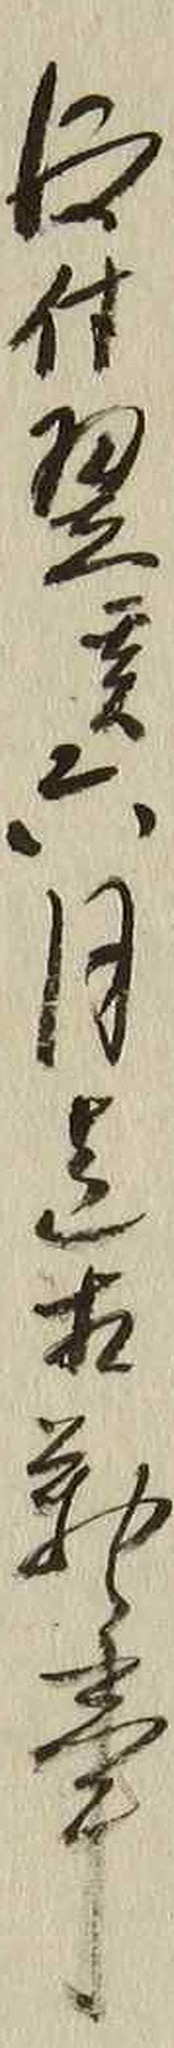仰付翌亥六月迄相勤候事
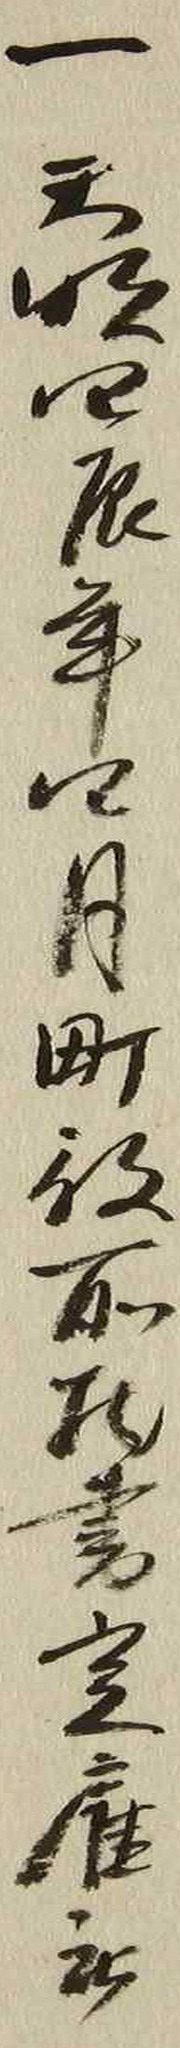一天明四辰年四月町役所物書定雇被
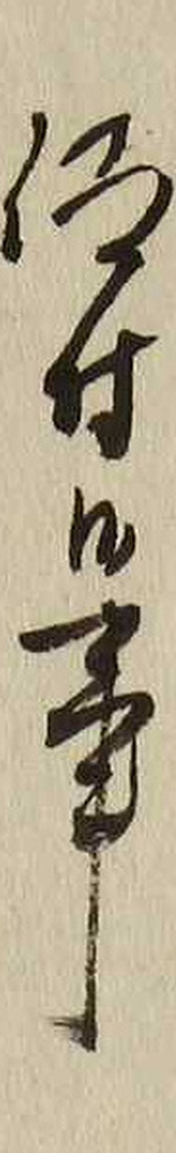仰付候事
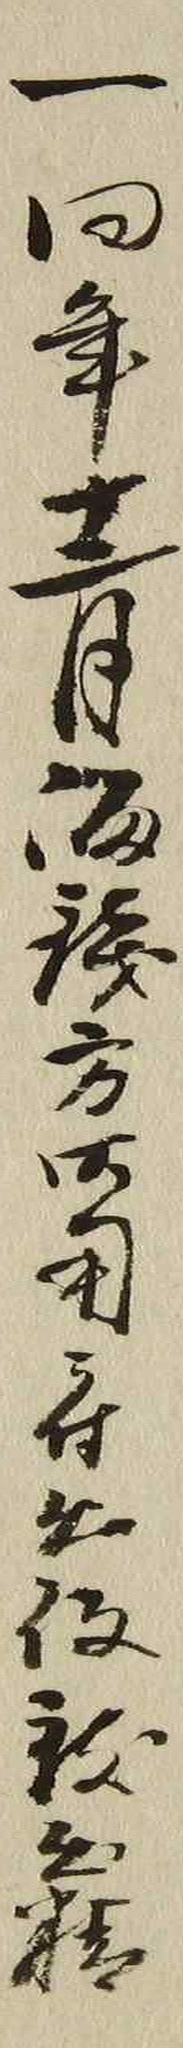一同年十二月溜銭方御用ニ付出役致出精
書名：諸士系譜　巻之360　す之部10
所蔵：会津若松市立会津図書館
